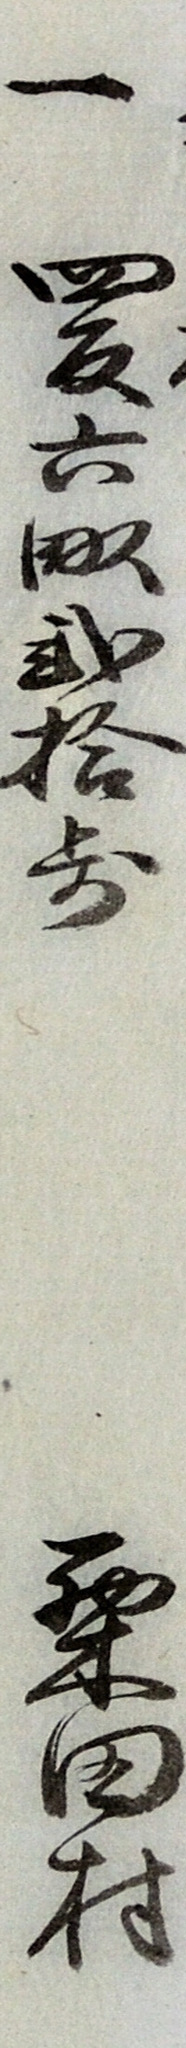一四反六㽗弐拾歩栗田村
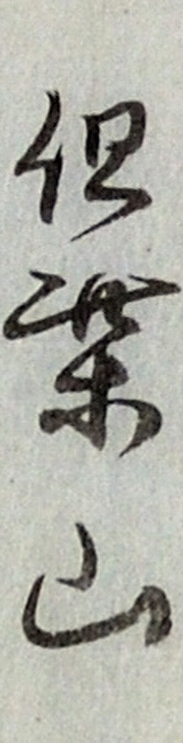但柴山
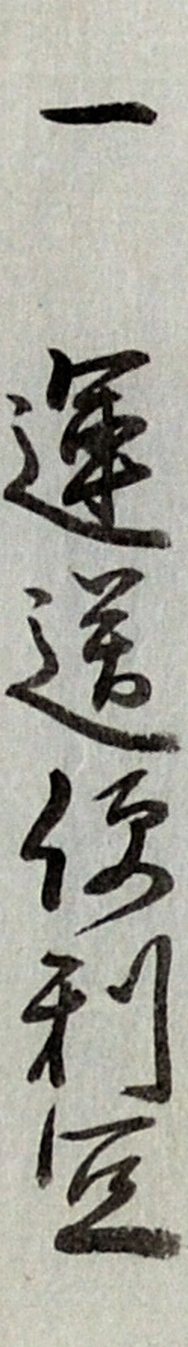一運送便利宜
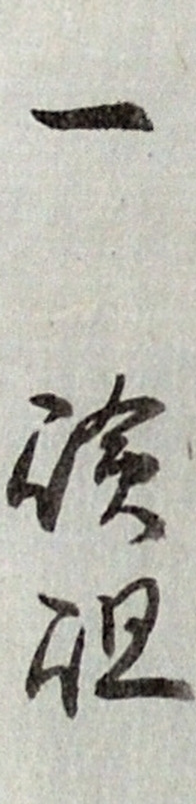一嶮岨

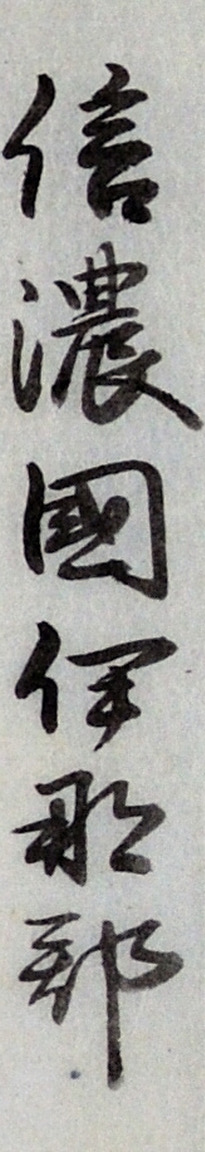信濃国伊那郡
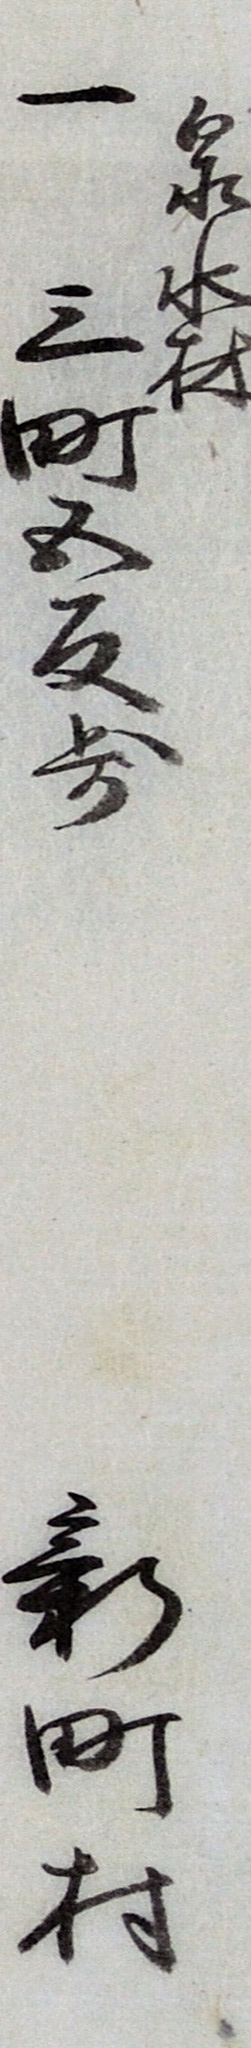一三町五反歩新町村
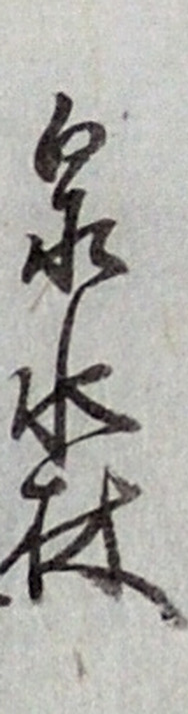泉水林
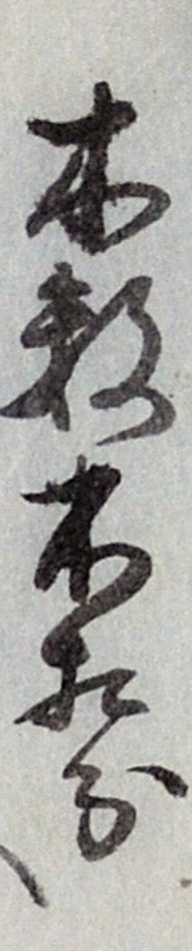木数不相分
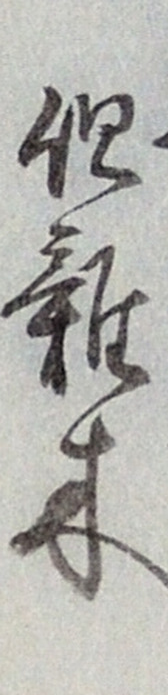但雑木
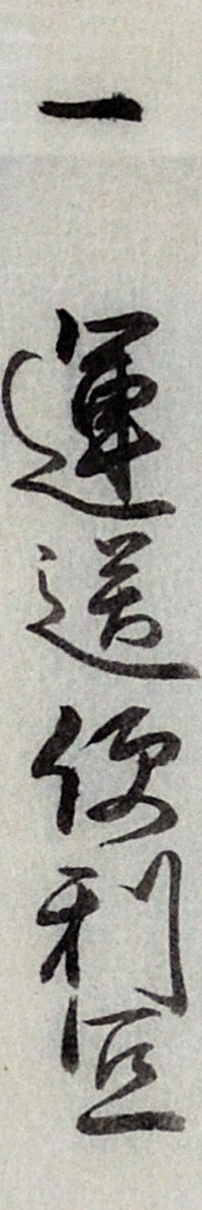一運送便利宜
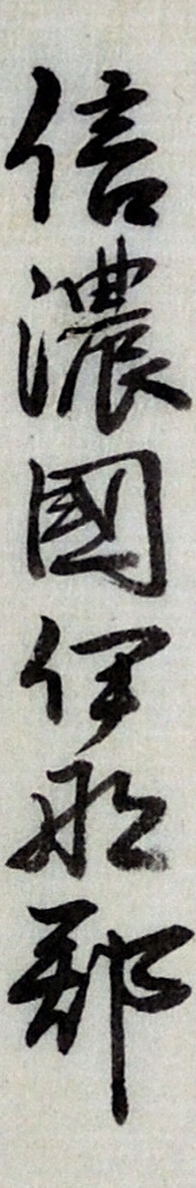信濃国伊那郡
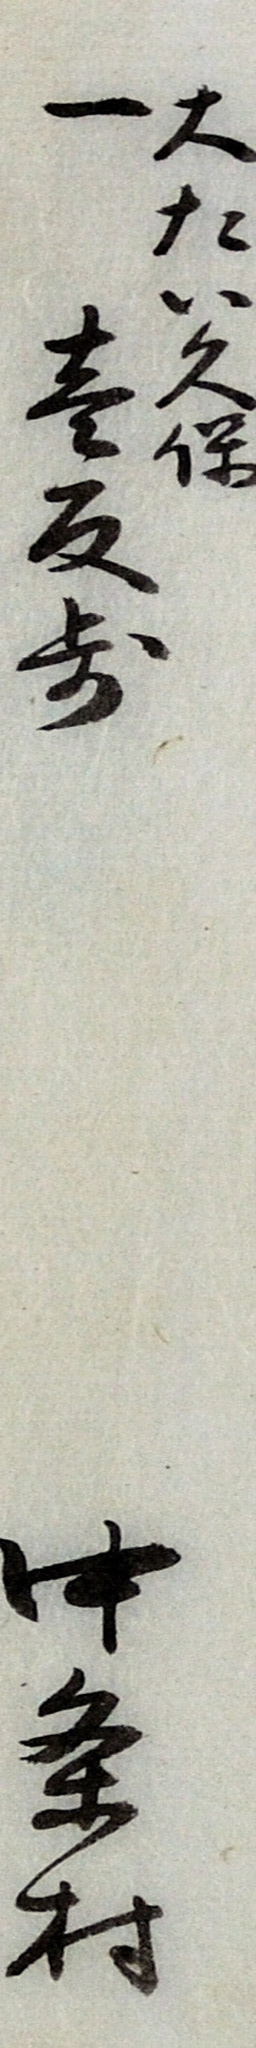一壱反歩中条村
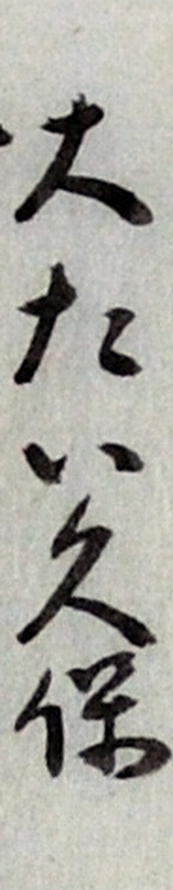大たい久保
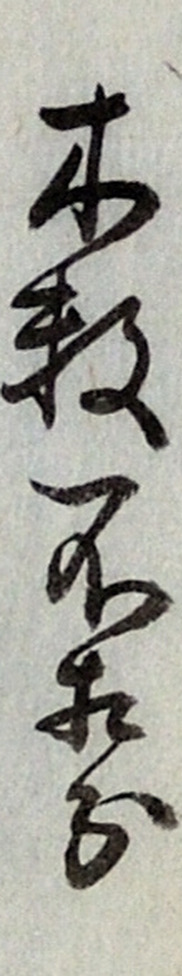木数不相分
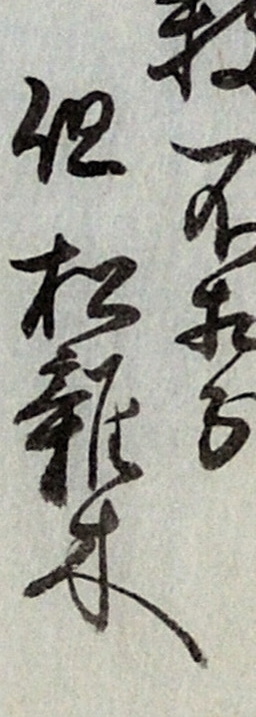但松雑木
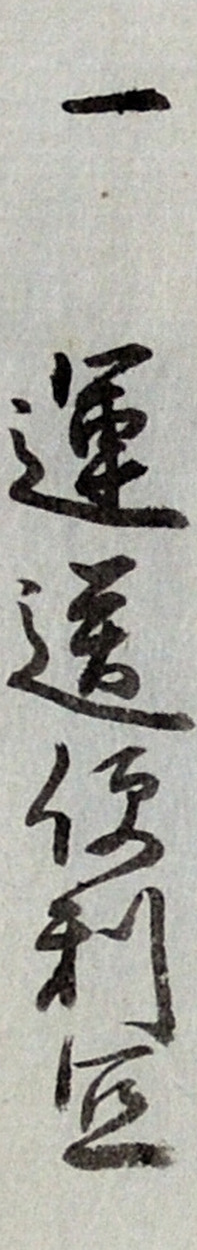一運送便利宜
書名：官林反別帳
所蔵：伊那市立高遠町図書館・合同会社AMANE
